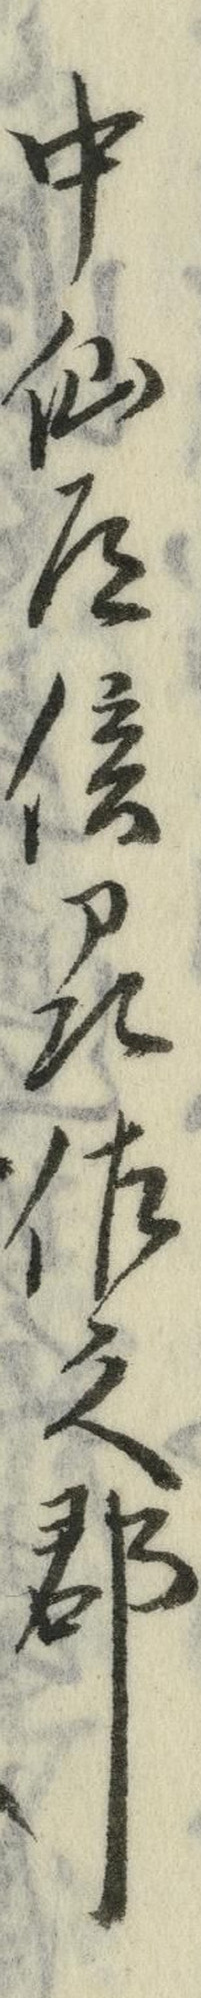中仙道信州佐久郡
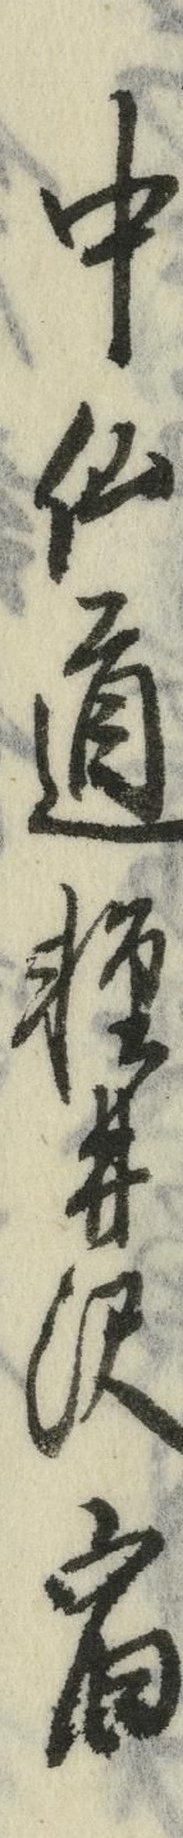中仙道軽井沢宿
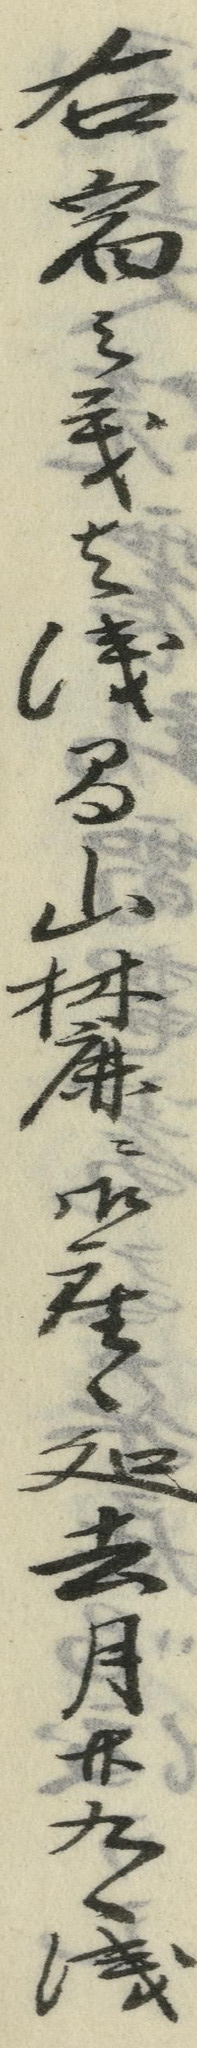右宿之義は浅間山麓ニ御座候処去月廿九日浅

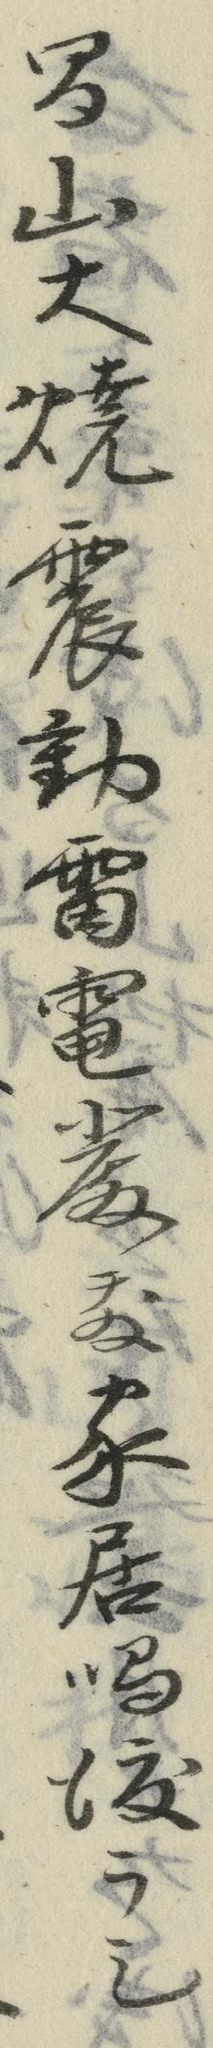間山大焼震動雷電厳敷家居鳴渡ラシ
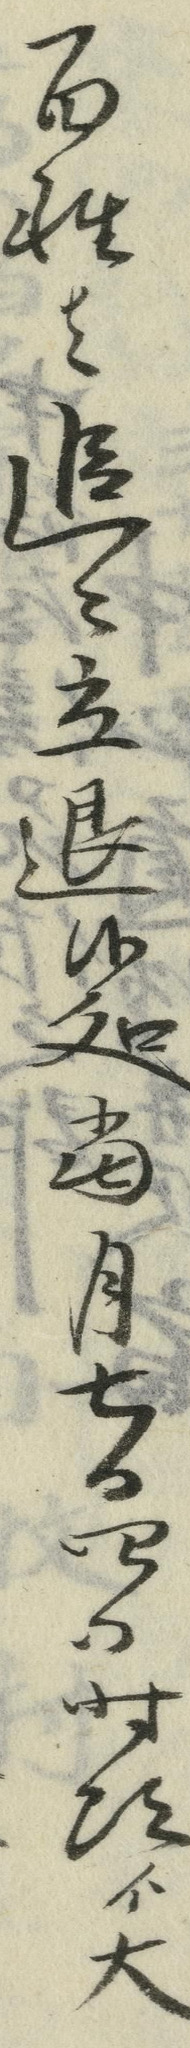百姓は追々立退候処当月七日四ツ時頃ゟ大
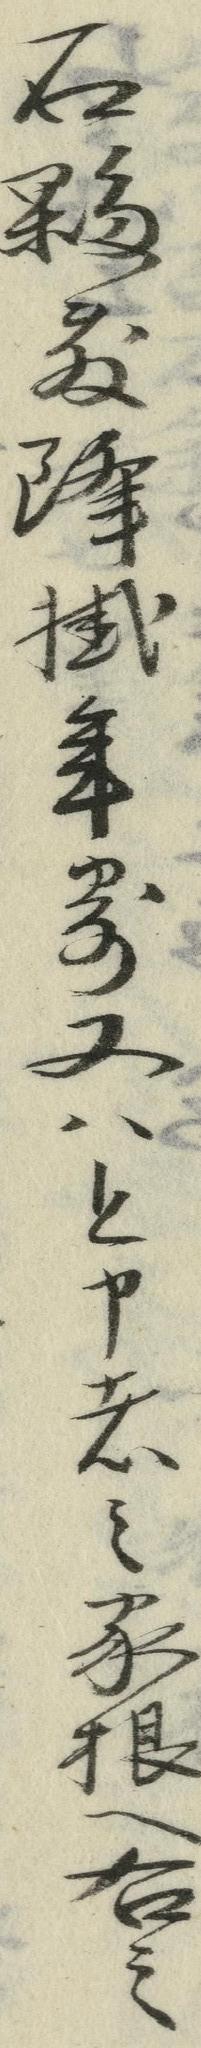石夥敷振掛年寄又八と申者之家根へ右之
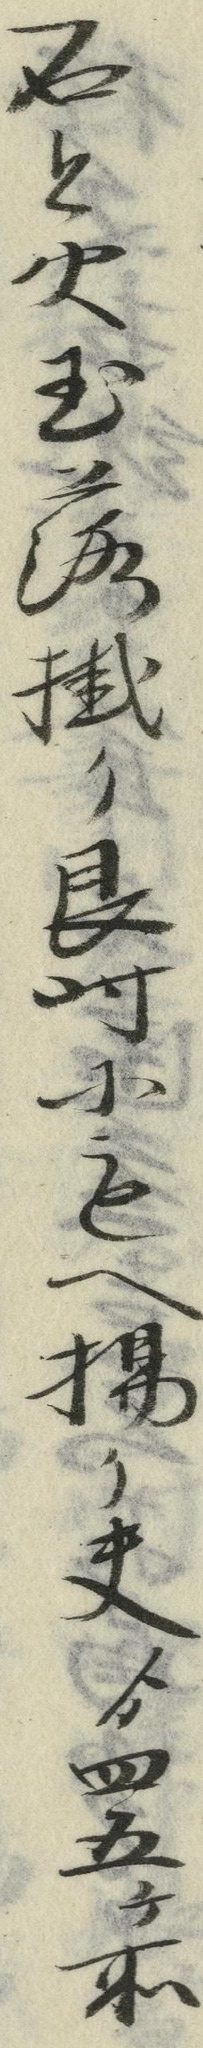石と火玉落掛リ艮時にもへ揚リ夫ゟ四五ケ所
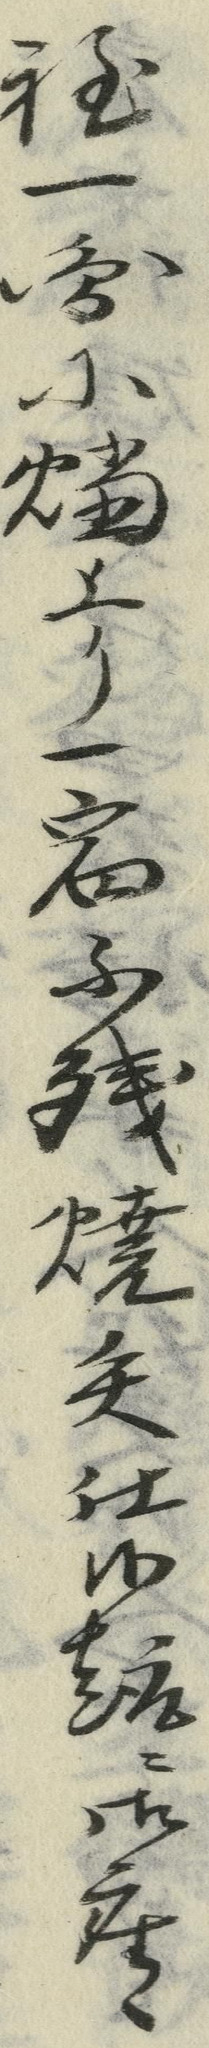程一円に焔上リ一宿夫残焼失仕候趣ニ御座候
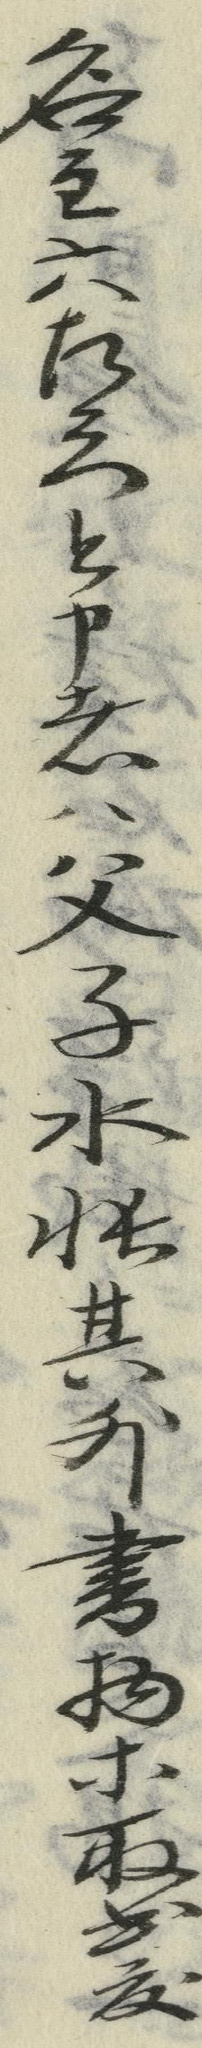名主六左衛門と申者は父子水帳其外書物等取出度
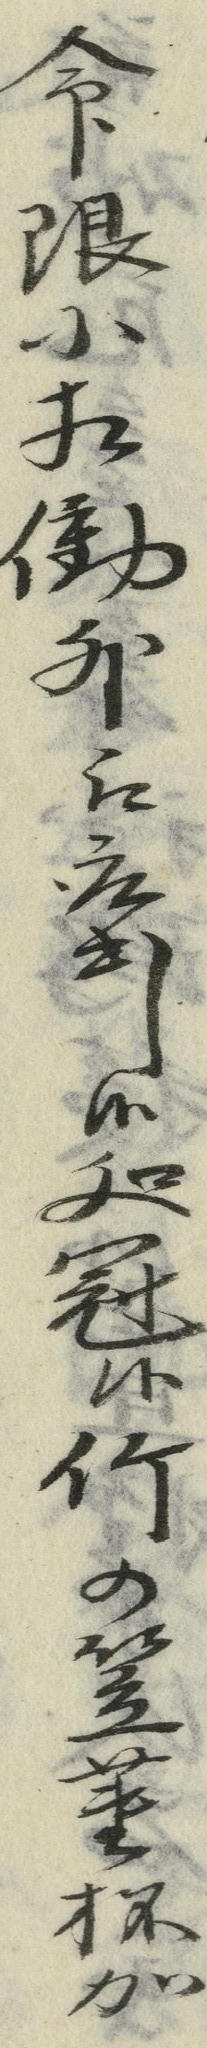命限に相働外江取出し候処冠候竹の笠蓙抔加
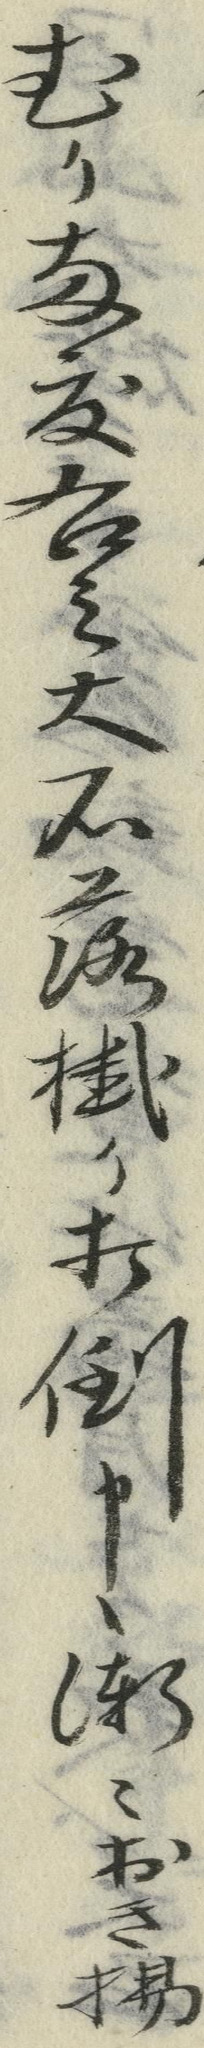むり両度右之大石落掛リ打倒申候漸ニおき揚
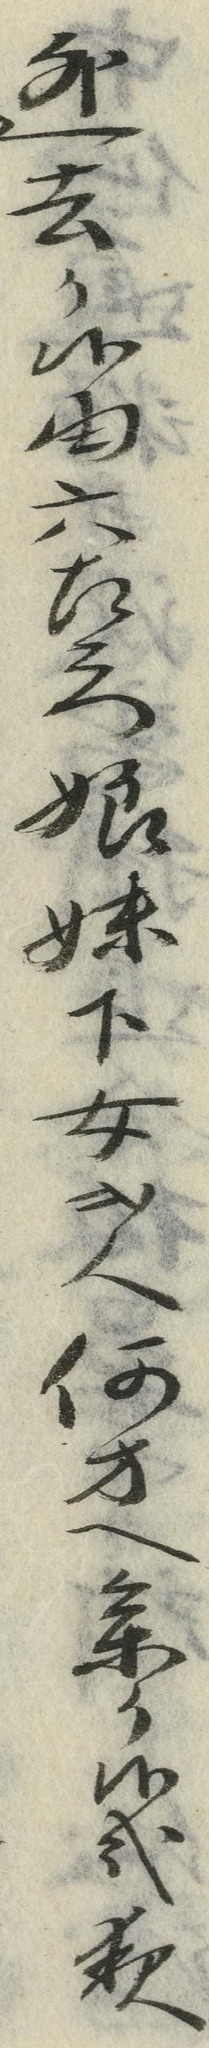逃去リ候由六左衛門娘妹下女弐人何方へ参リ候哉夜
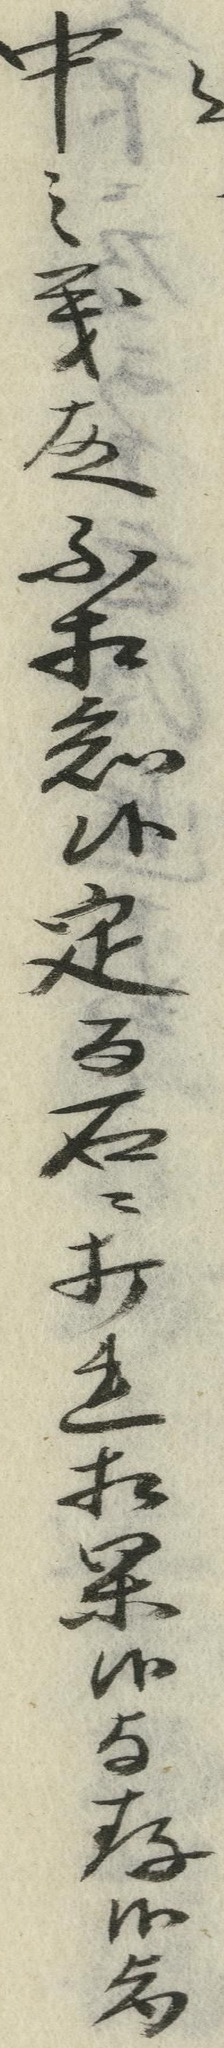中之義故不相知候定而石ニ打れ相果候と存候旨
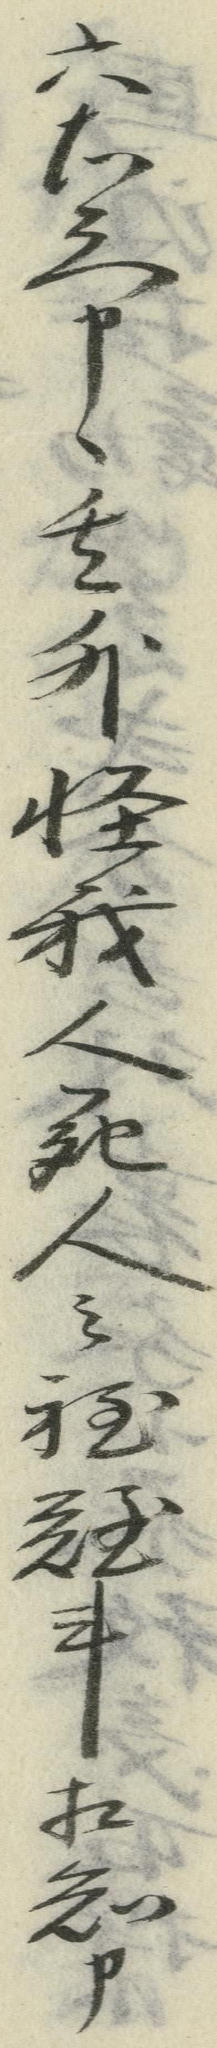六右衛門申候其外怪我人死人之程難斗相知申
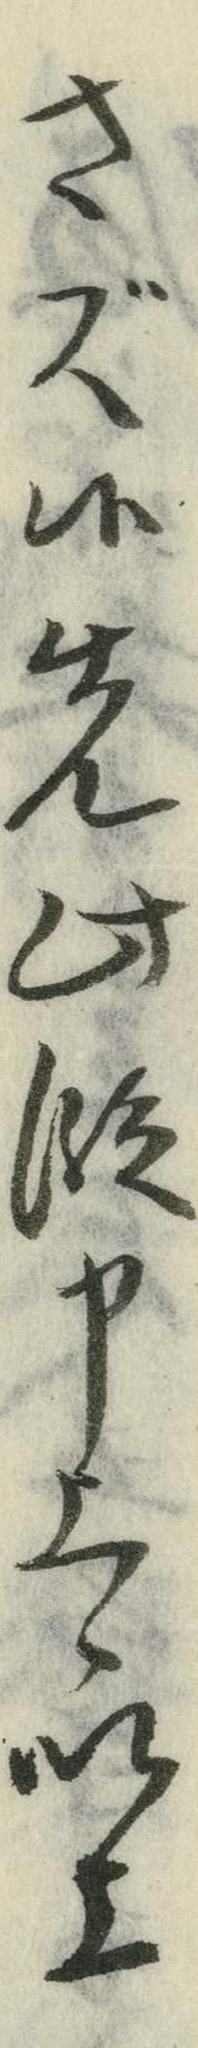さズ候先此段申上候以上
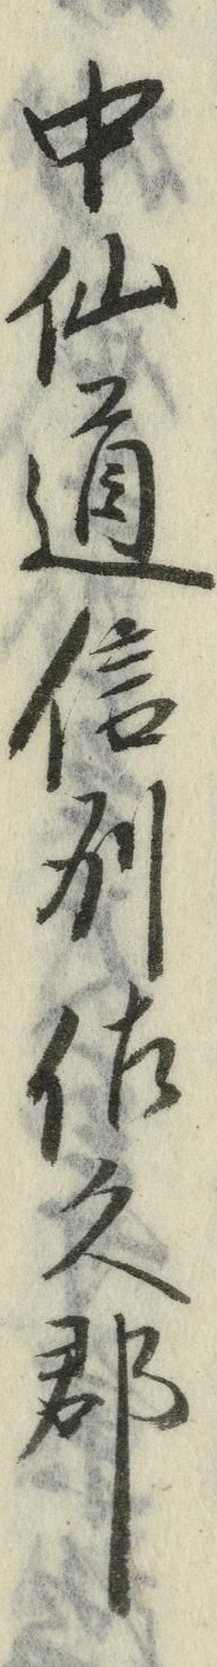中仙道信州佐久郡
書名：天明三癸卯七月信州浅間山焼出シ上州山津浪ニ付近國ヨリ御届書并訴書写
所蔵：東京大学地震研究所図書室 Earthquake Research Institute Library, The University of Tokyo, JAPAN
